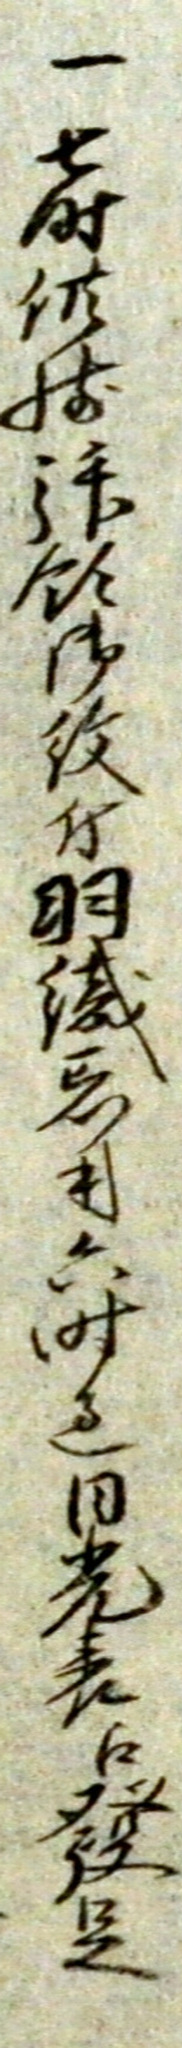一七時供揃拝領御紋付羽織着用六時過日光表江発足
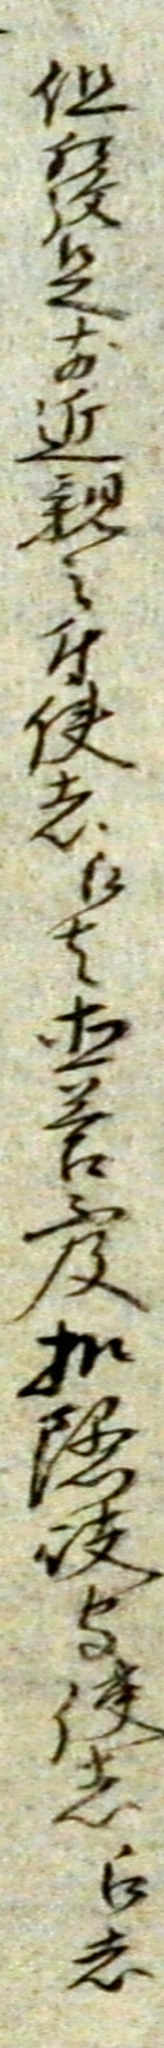但発足前近親之付使者江者直答不及扣隠岐守使者江者
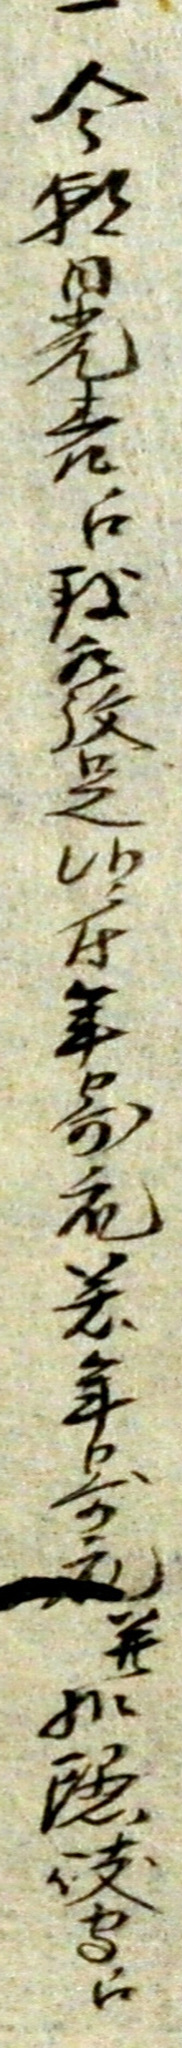一今朝日光表江致発足候ニ付年寄衆幷若年寄衆幷扣隠岐守江
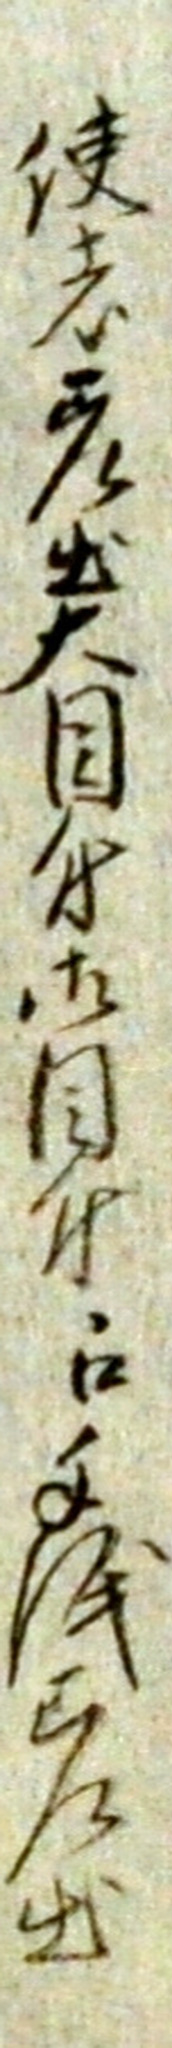使者差出大目付御目付江手紙差出
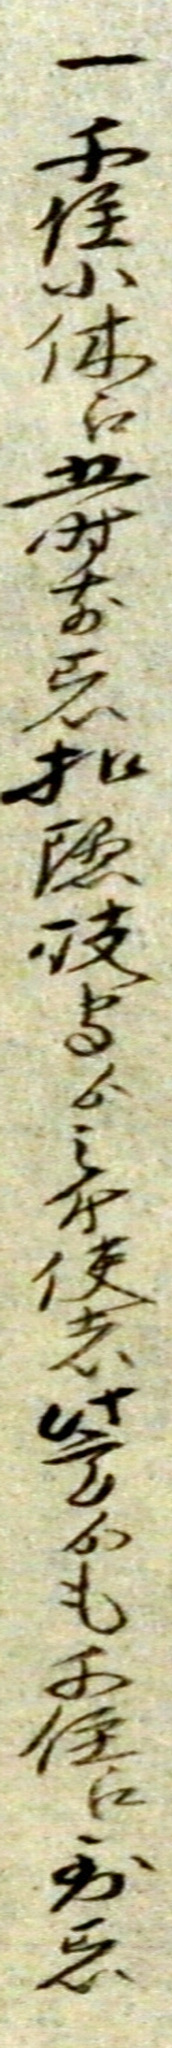一千住小休江五時前着扣隠岐守ゟ之付使者此方ゟも千住江到着
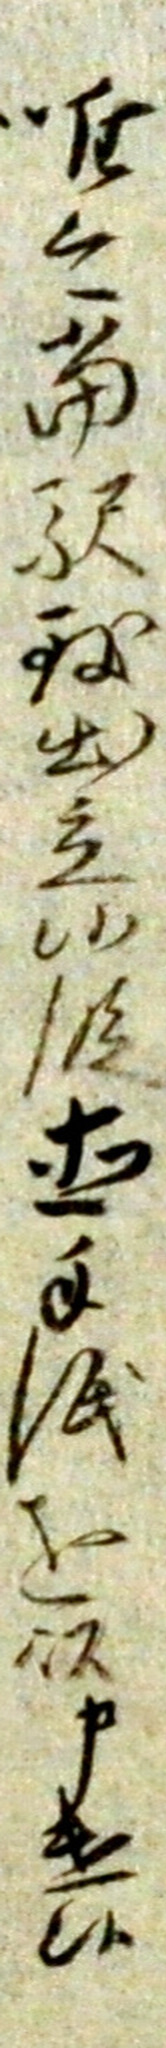唯今当駅致出立候段直手紙を以申遣候
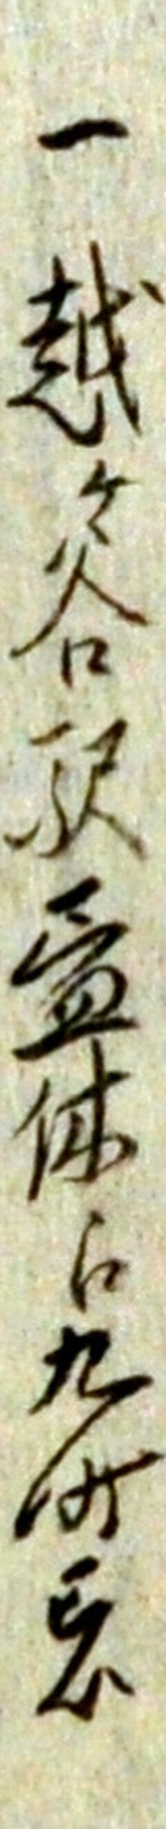一越谷駅壱休江九時着
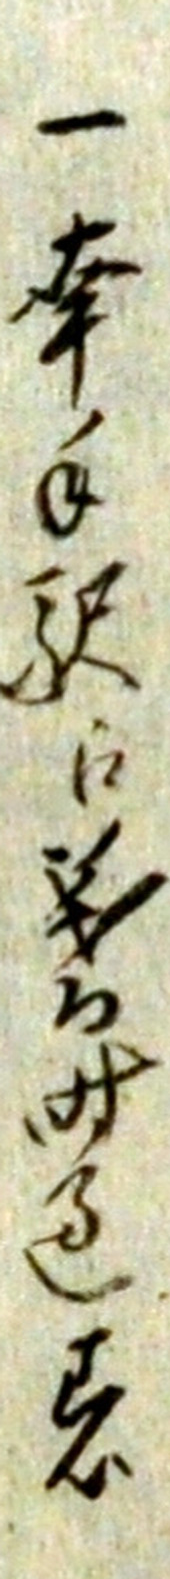一幸手駅江七つ時過着
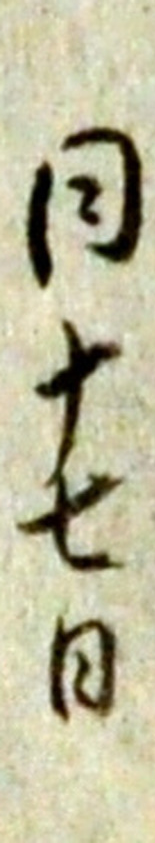同十七日
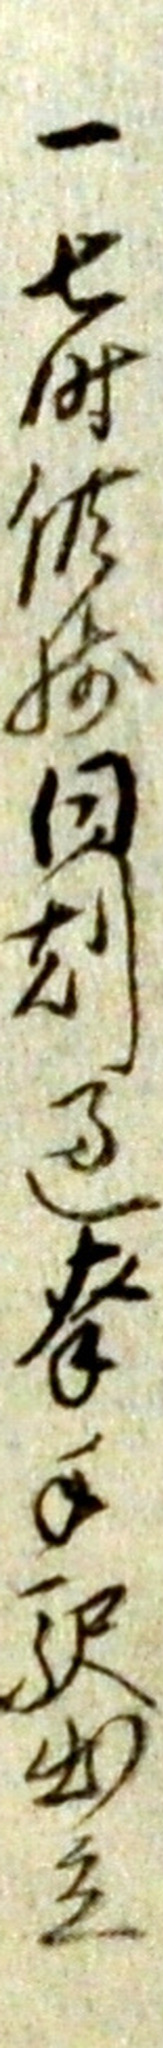一七時供揃同刻過幸手駅出出立
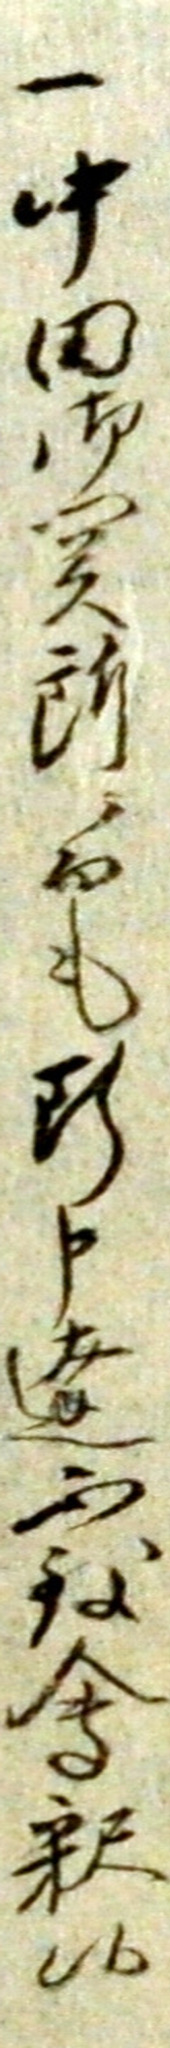一中田御関所ニ而も断申達不致会釈
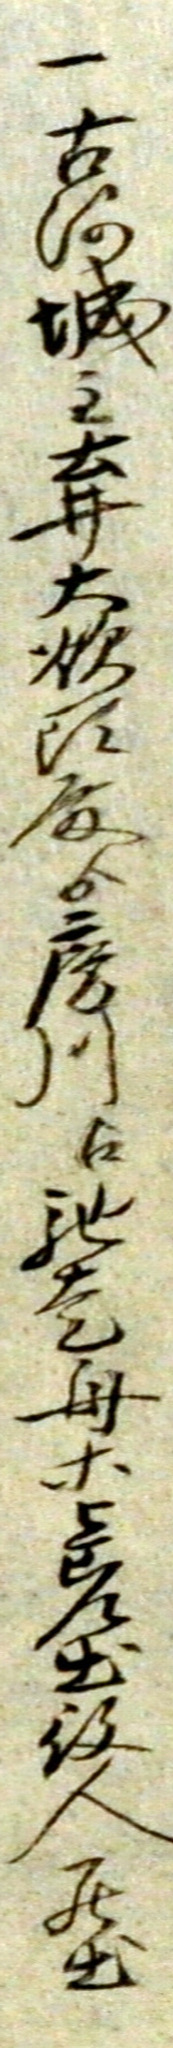一古河城之土井大炊頭殿ゟ房州江馳走舟抔差出役人罷出
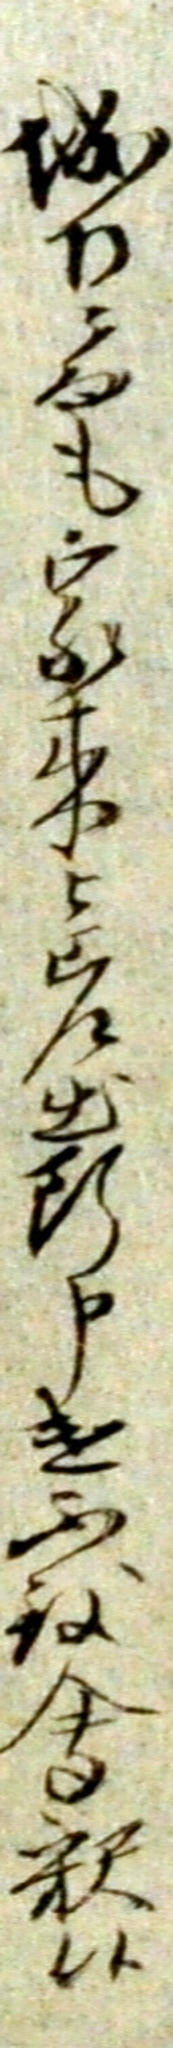城下ニ而も家来ヒ差出断申遣不致会釈候
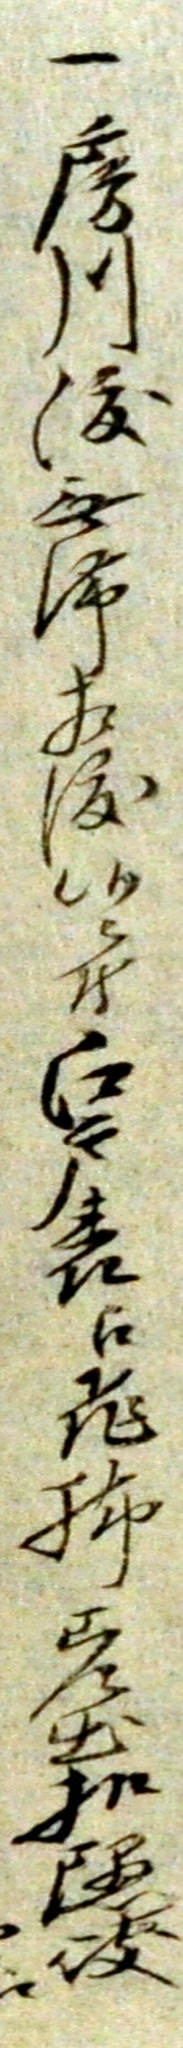一房州後無滞相渡候ニ付江戸表江飛脚差出扣隠岐守江
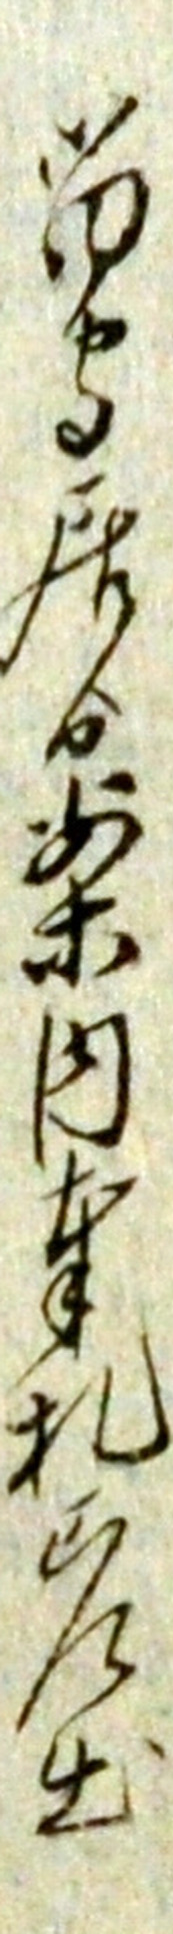留守居ゟ案内奉札差出
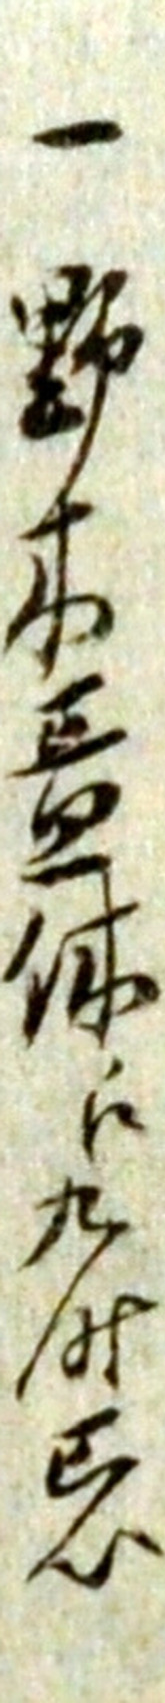一野木昼休江九時着
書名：日光御名代相勤候節ノ留
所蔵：伊那市立高遠町図書館・合同会社AMANE
